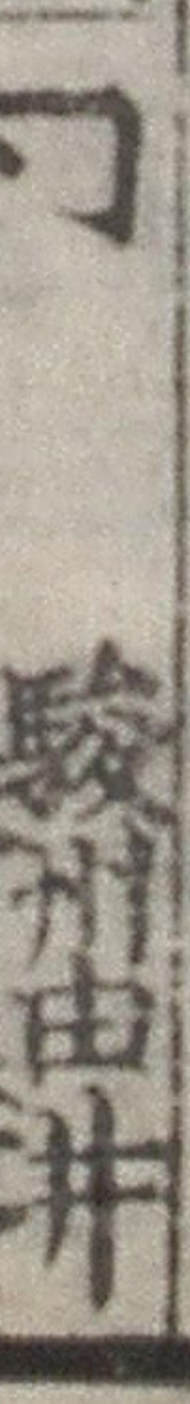同駿州由井
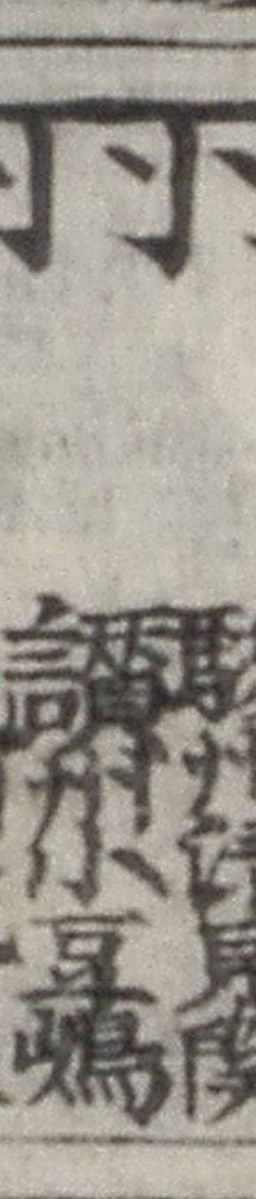同讃州小豆嶋
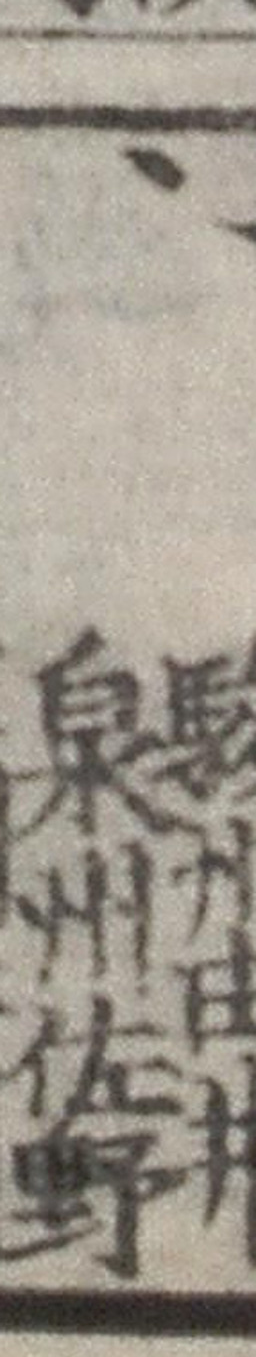同泉州佐野
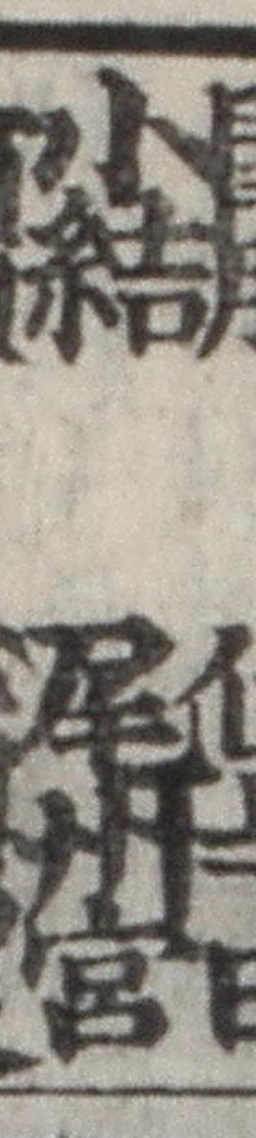小結尾州宮
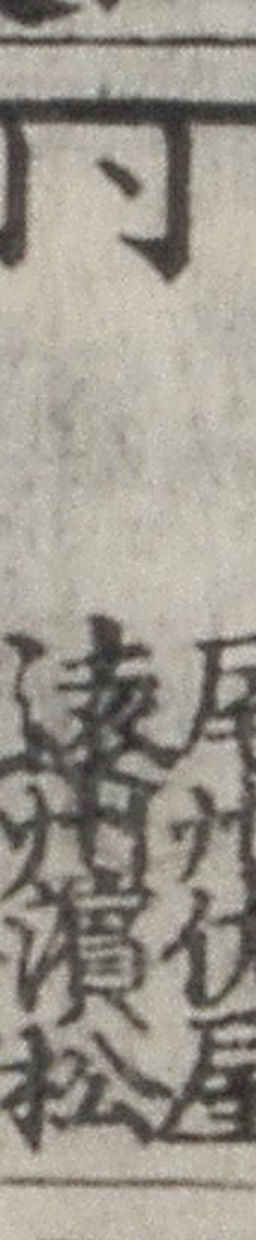同遠州浜松
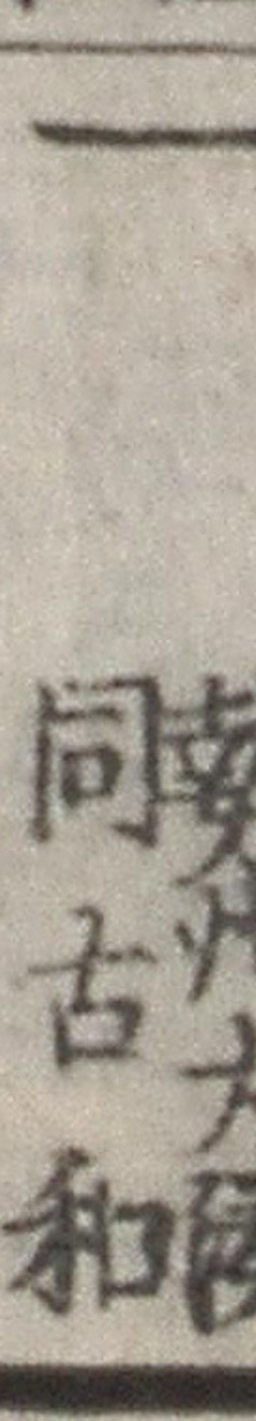同同古和
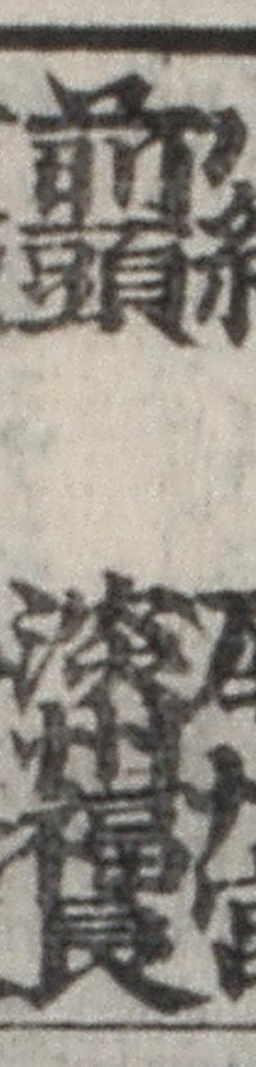前頭淡州福良
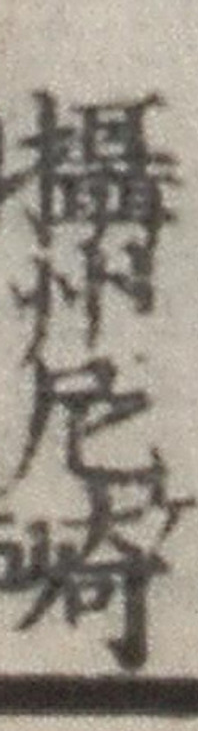同摂州西宮
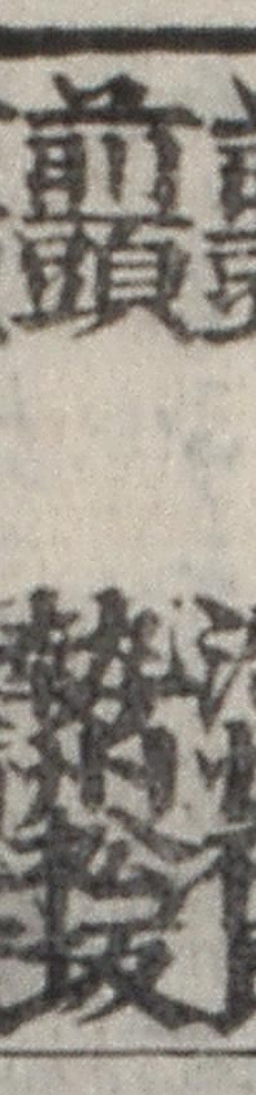前頭勢州松坂
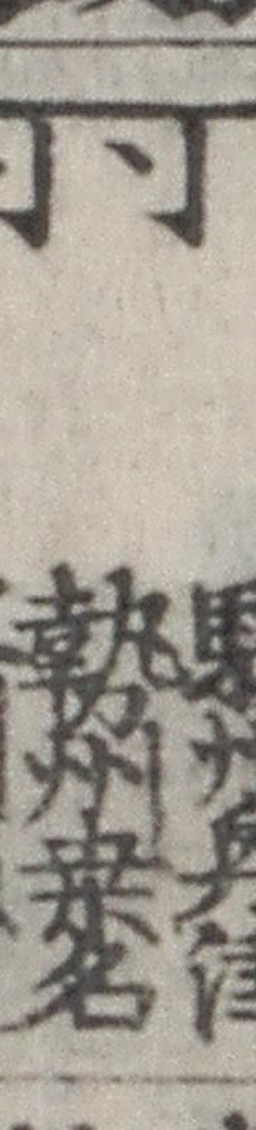同勢州桑名
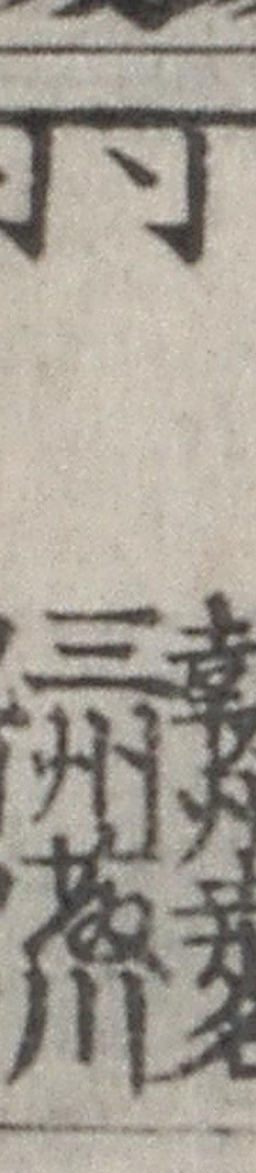同三州藤川
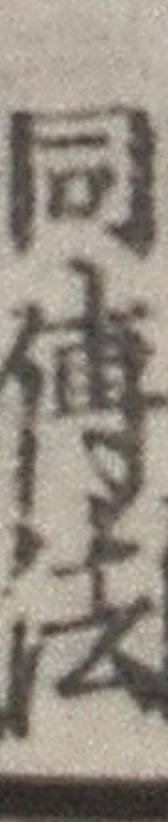同伝法
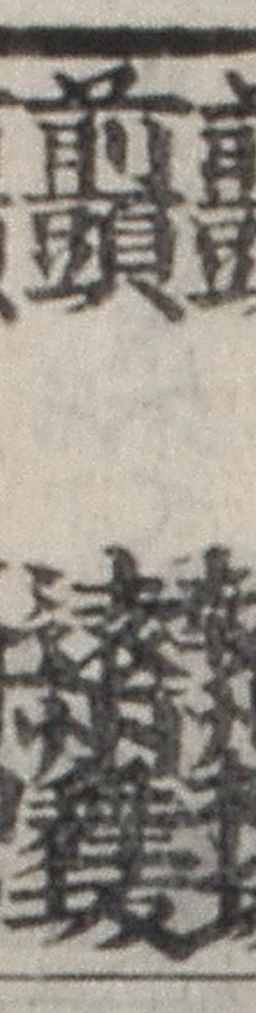前頭淡州福良
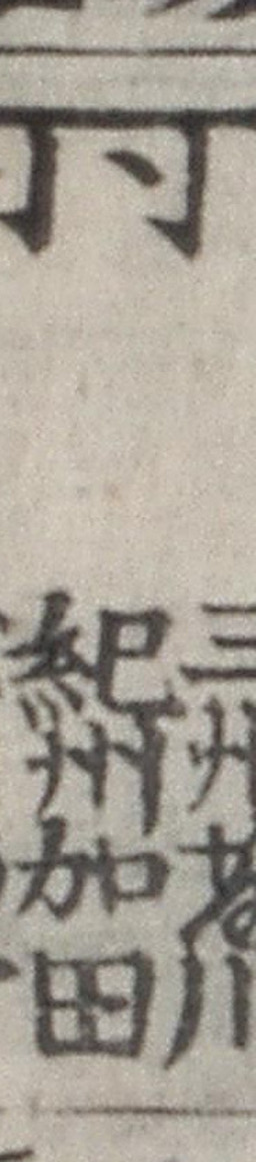同紀州加田
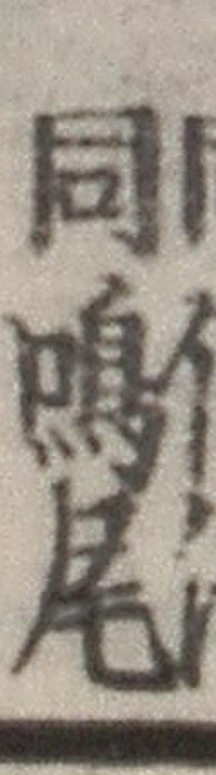同鳴尾
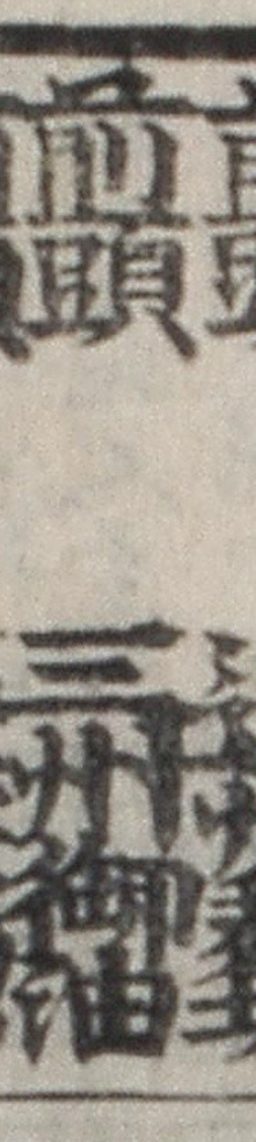前頭三州御油
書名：諸國大地震年代記　末代噺種
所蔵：東京大学地震研究所図書室 Earthquake Research Institute Library, The University of Tokyo, JAPAN
